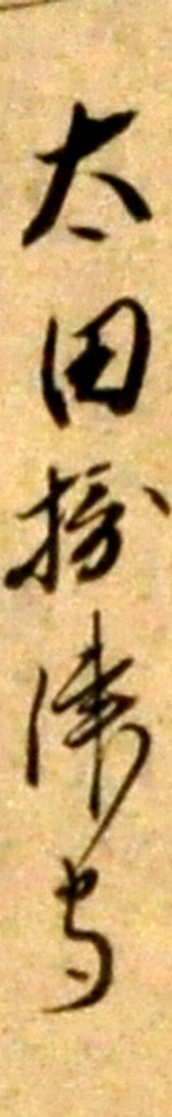太田摂津守
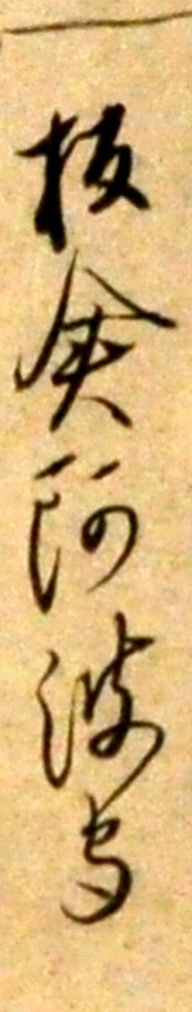板倉阿波守
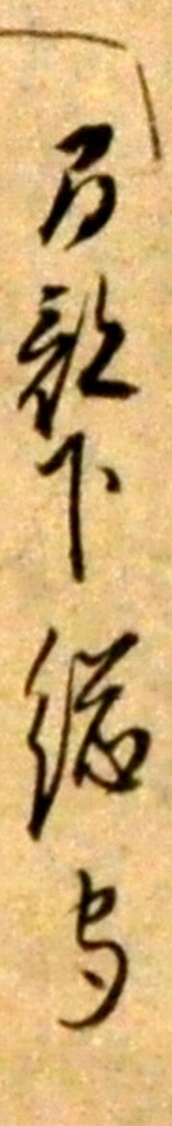本多下総守
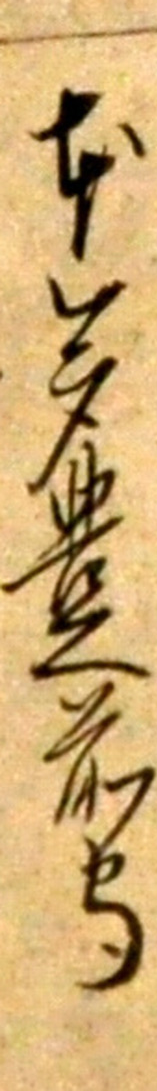本多下総守
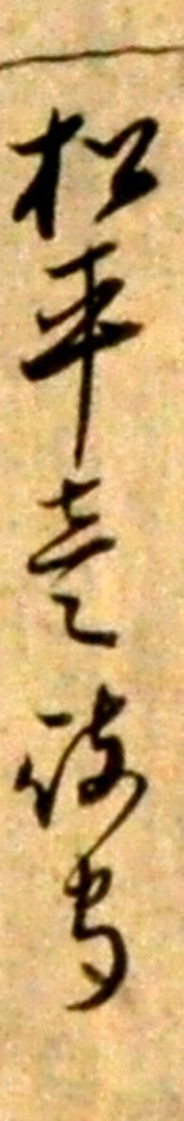松平丹波守

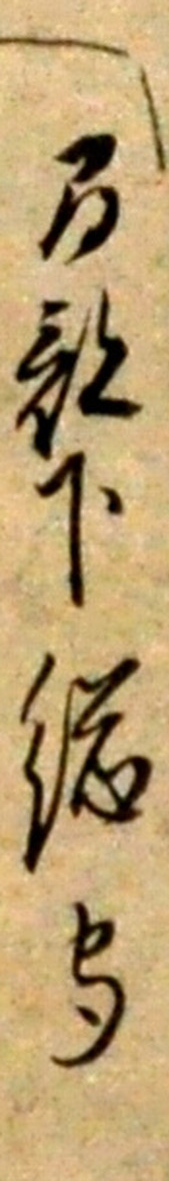間部下総守
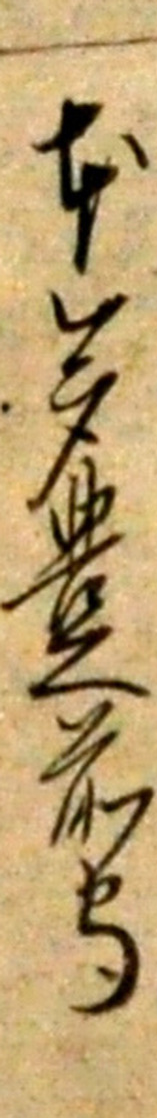本多豊前守
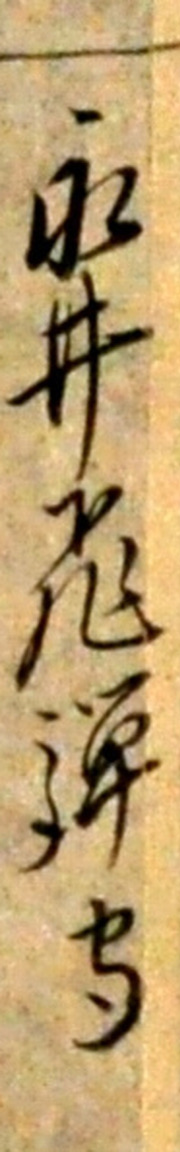永井飛騨守
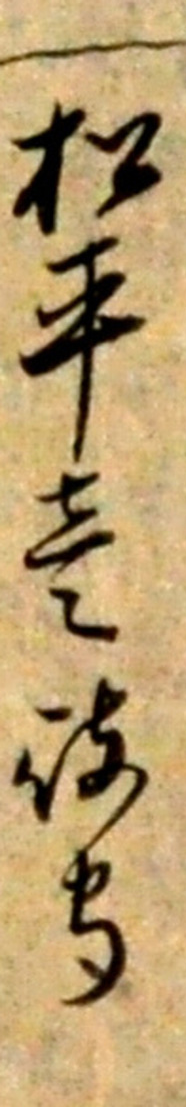松平壱岐守
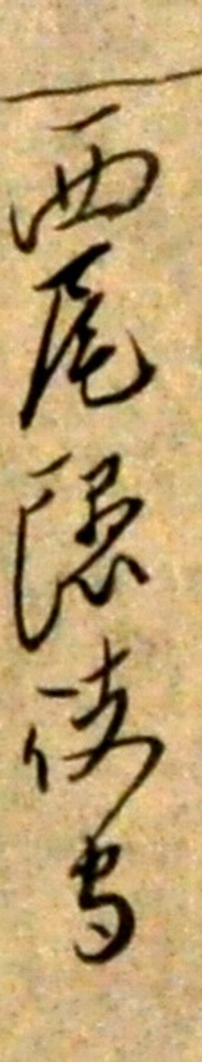西尾隠岐守
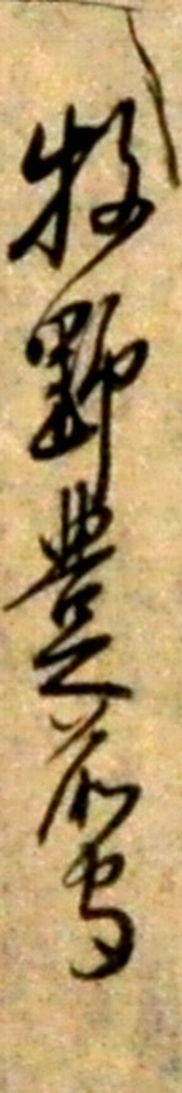牧野豊前守
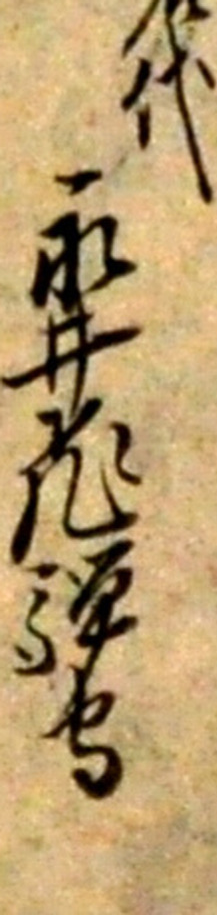永井飛騨守
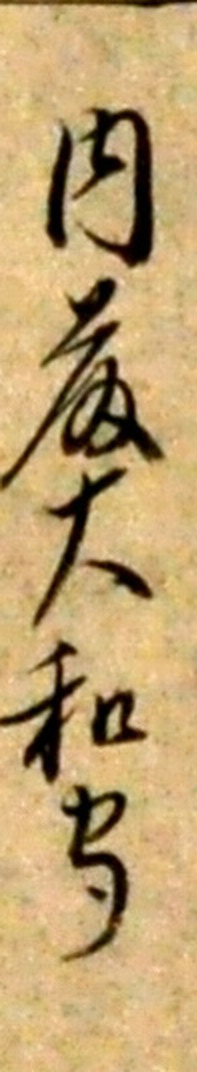内藤大和守
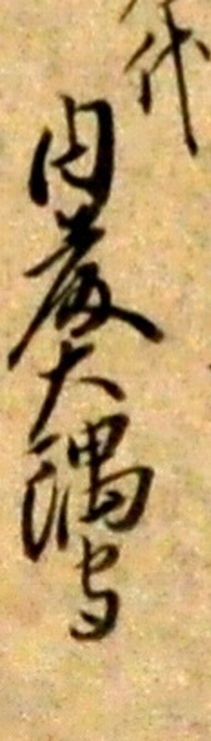内藤大和守
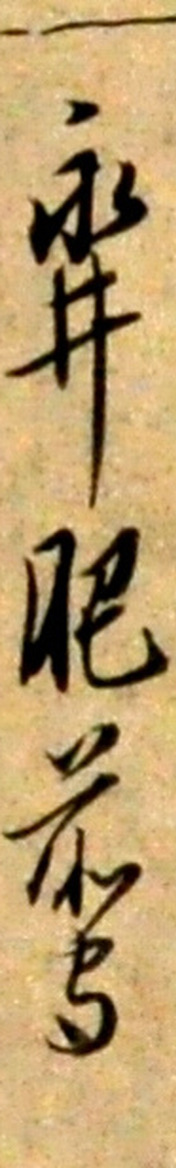永井肥前守
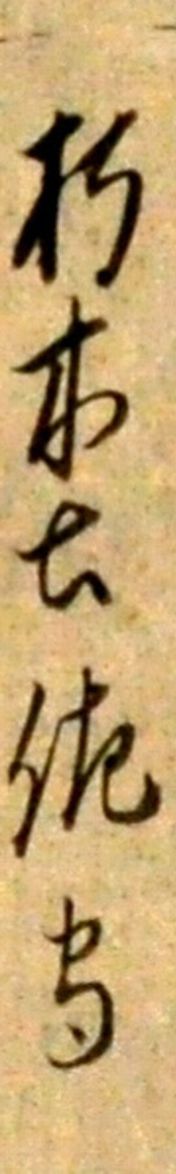朽木土佐守
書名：御鷹ノ雁拝領ニ付名代トシテ登城ノ節ノ留
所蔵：伊那市立高遠町図書館・合同会社AMANE
